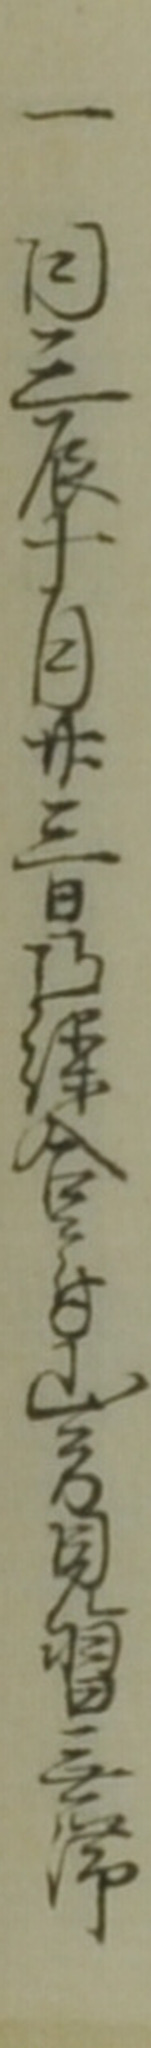一同三辰十月廿三日御繰合ニ付山方見習無滞
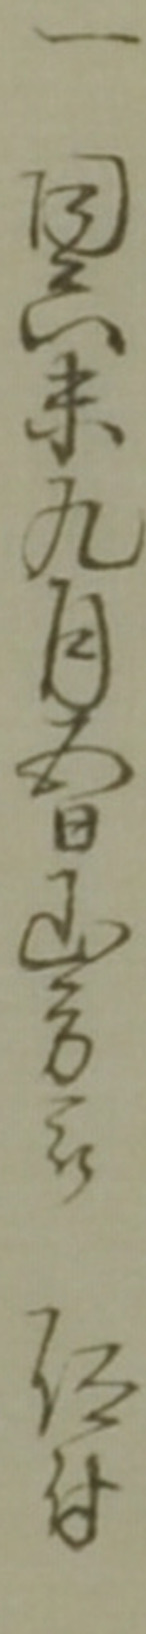一同六未九月五日山方被仰付
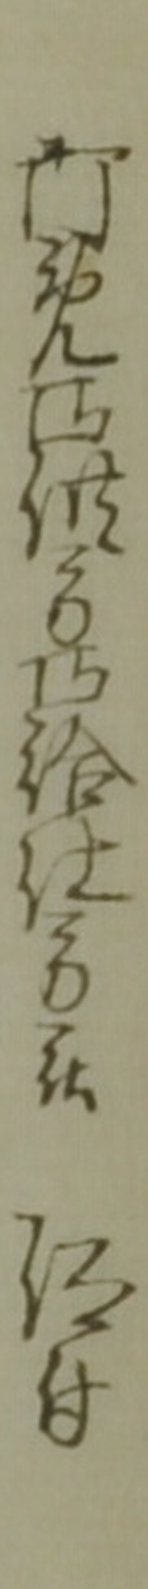御免御供方御給仕方被仰付
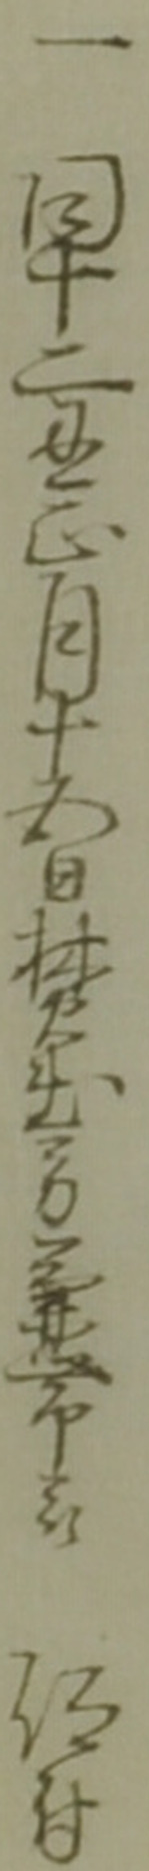一同十二丑正月十五日焚出方兼帯被仰付
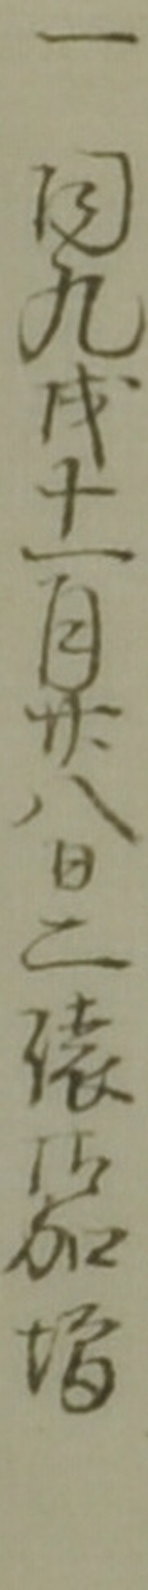一同九戌十一月廿八日二俵御加増
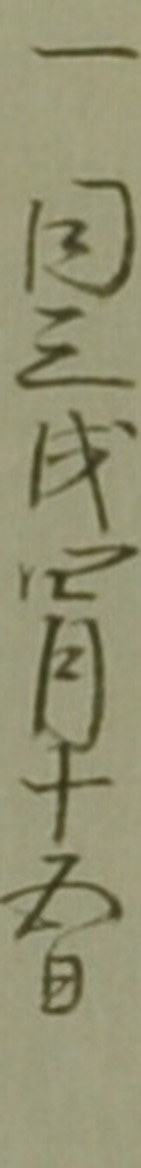一同三戌四月十五日
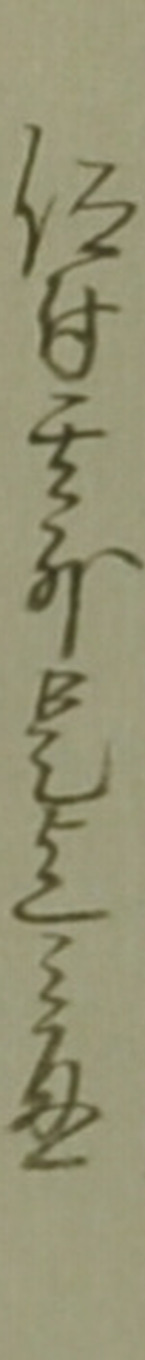仰付其外是迄之通
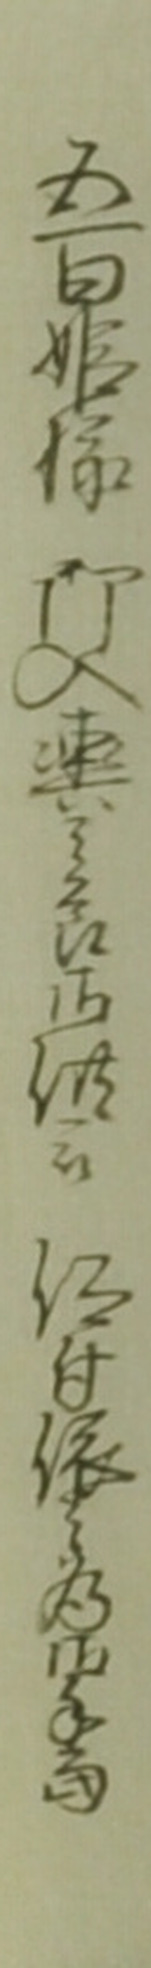五百姫様御入輿之節御供被仰付依之為御手当
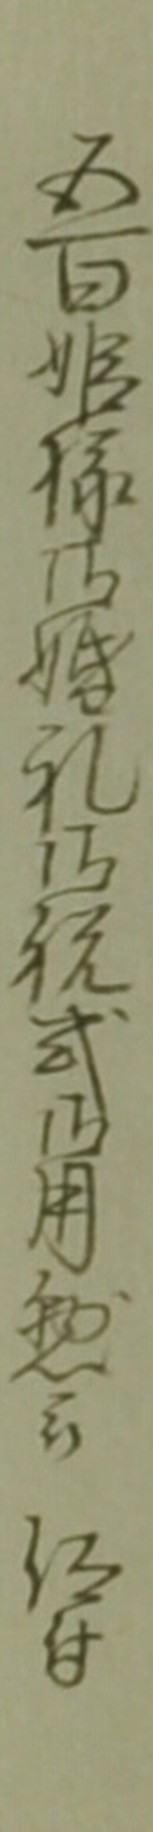五百姫様御婚礼御祝式御用懸被仰付
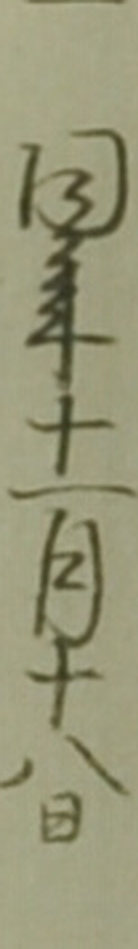一同年十一月十八日

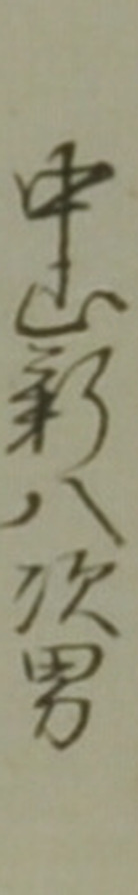中山新八次男
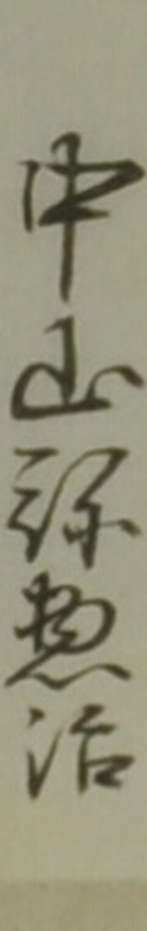中山弥惣治

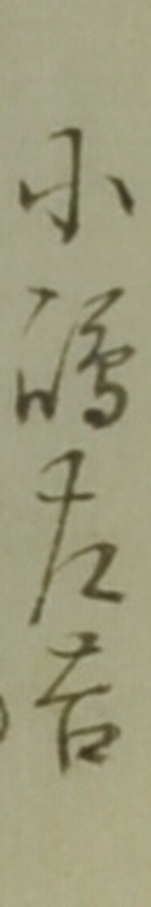小嶋左吉
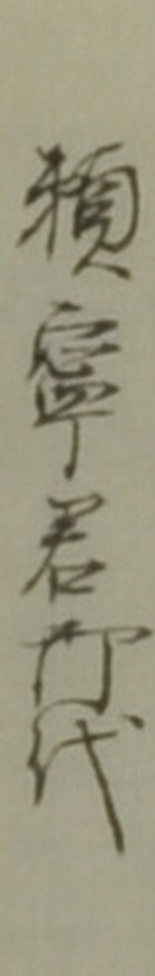頼寧君御代
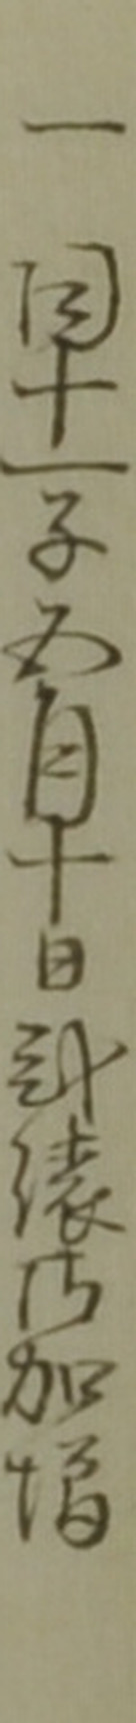一同十一子五月十日弐俵御加増
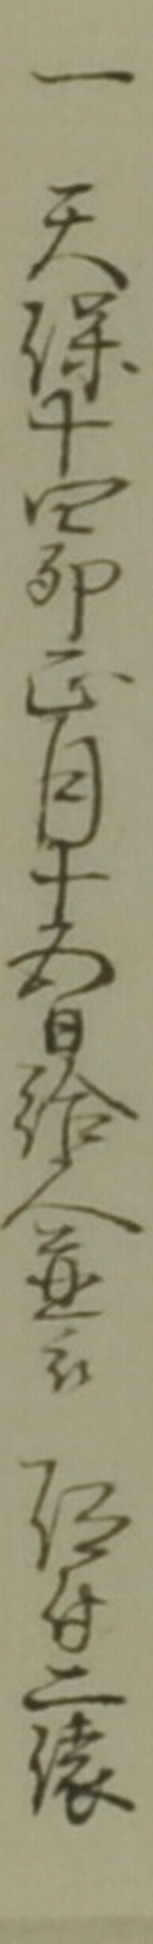一天保十四卯正月十五日給人並被仰付二俵
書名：無足諸士勤仕録（一）
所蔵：伊那市立高遠町図書館・合同会社AMANE
